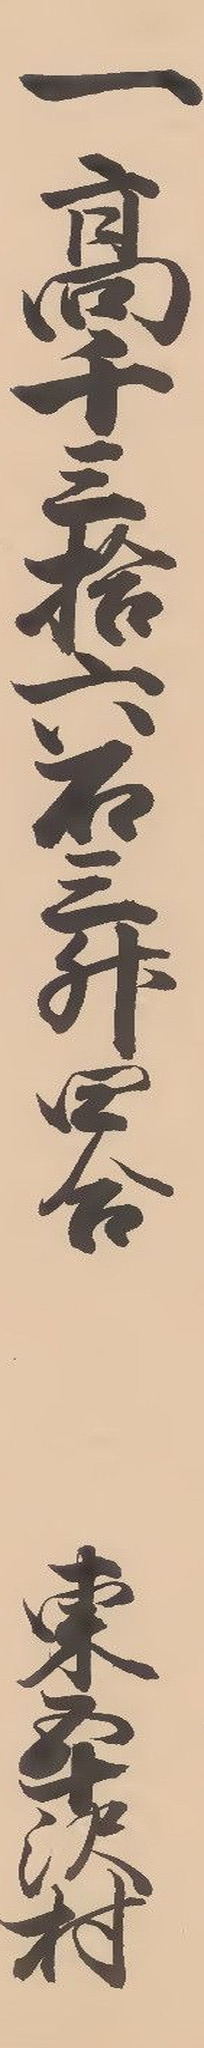一高千三拾六石三升四合東五十沢村
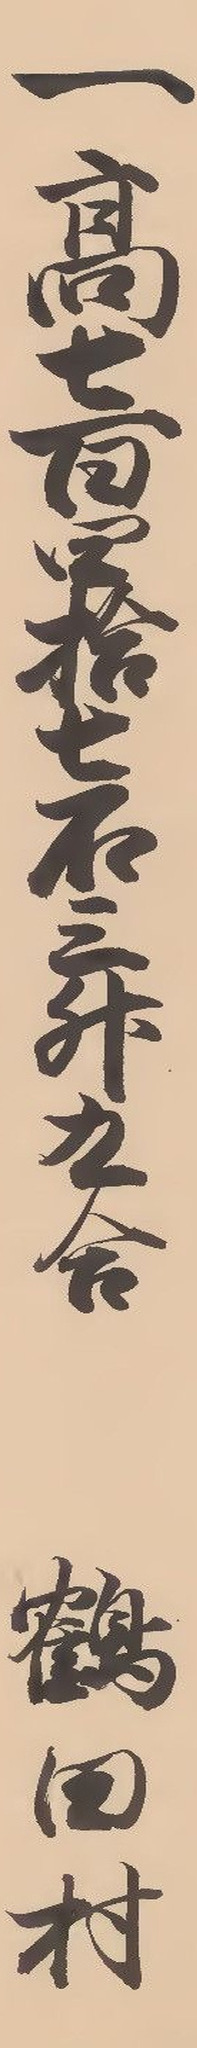一高七百四拾七石三升九合鶴田村
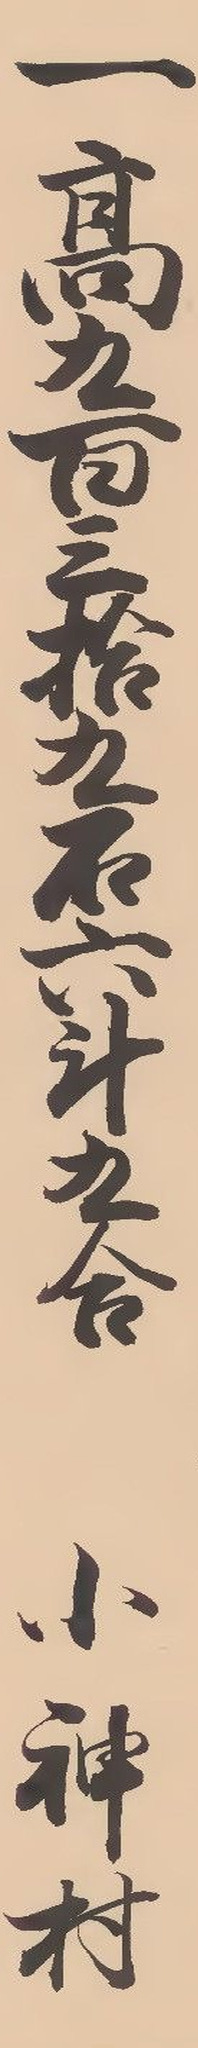一高九百三拾九石六斗九合小神村
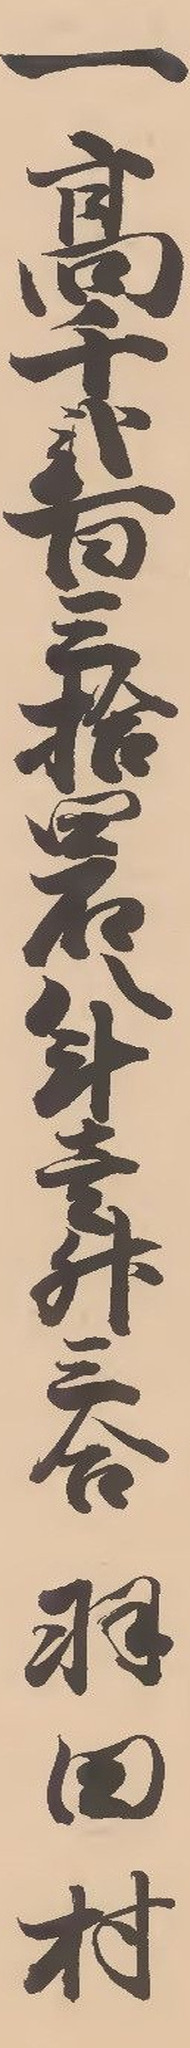一高千弐百三拾四石八斗壱升三合羽田村
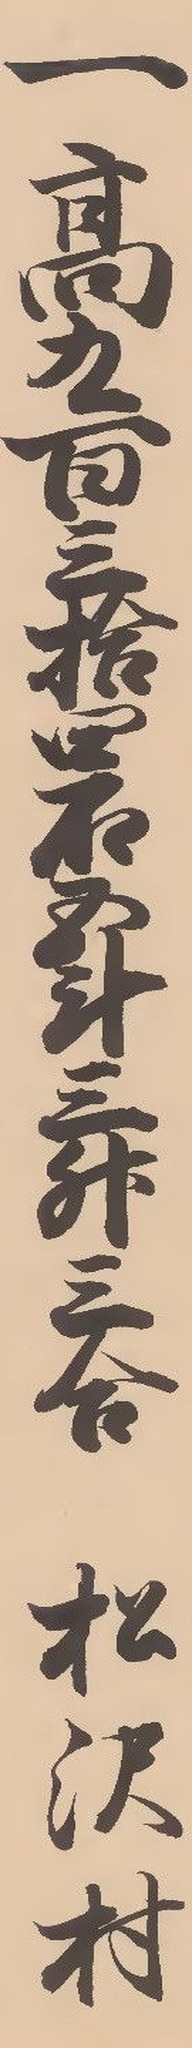一高九百三拾四石五斗三升三合松沢村
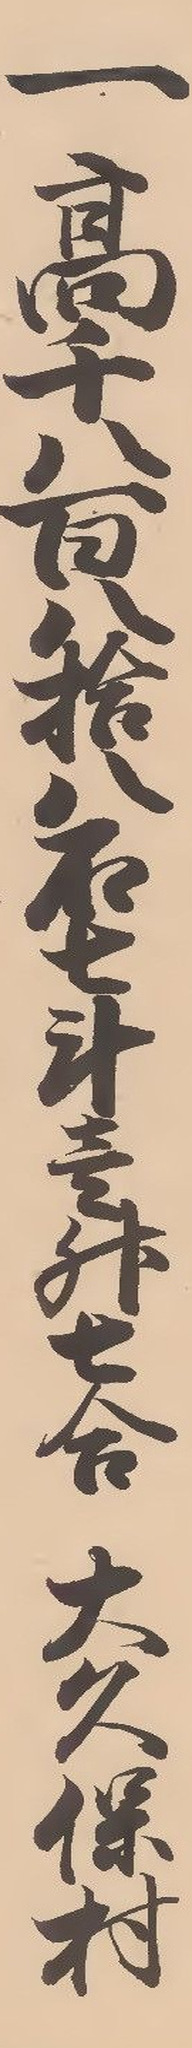一高千八百八拾八石七斗壱升七合大久保村
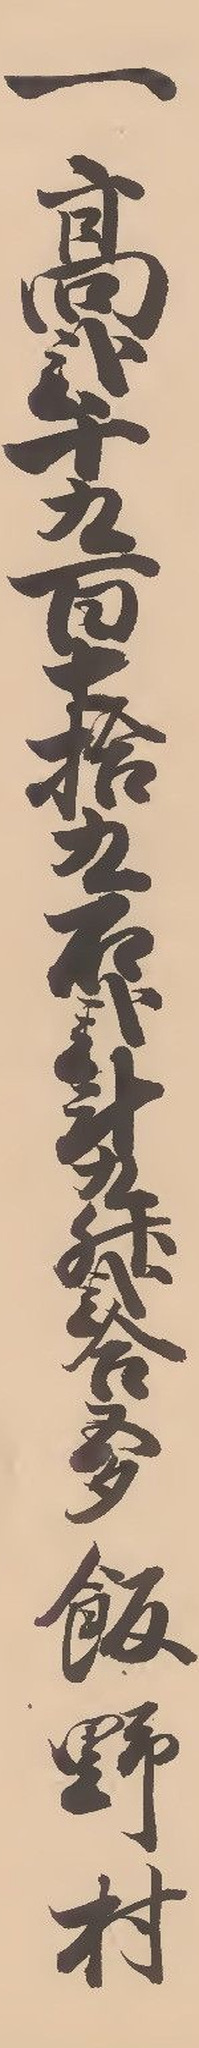一高弐千九百七拾九石弐斗九升弐合五勺飯野村

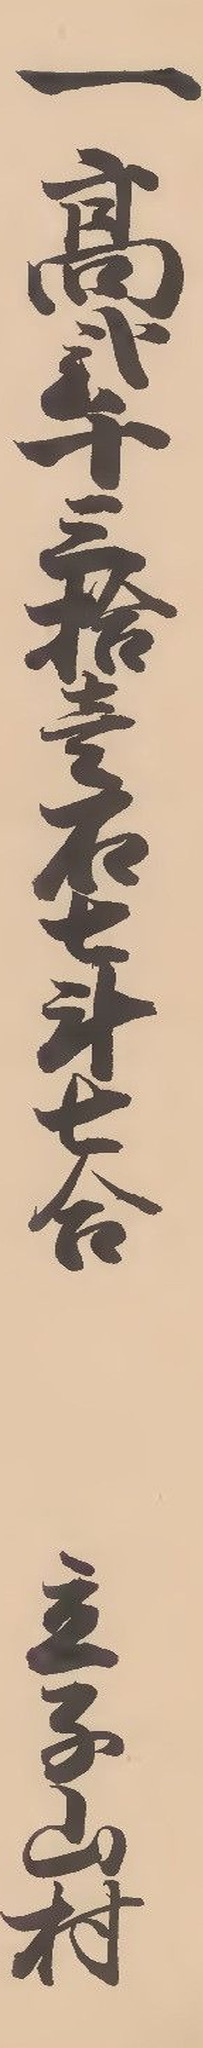一高弐千三拾壱石七斗七合立子山村
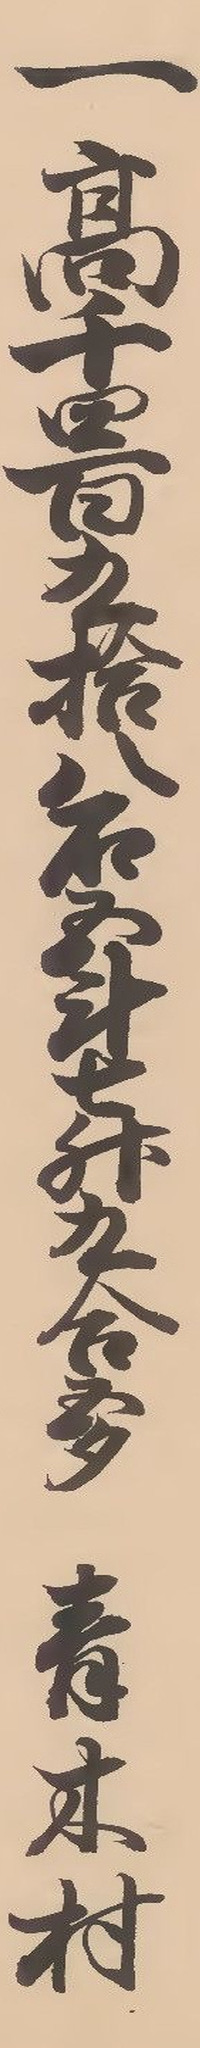一高千四百九拾八石五斗七升九合五勺青木村
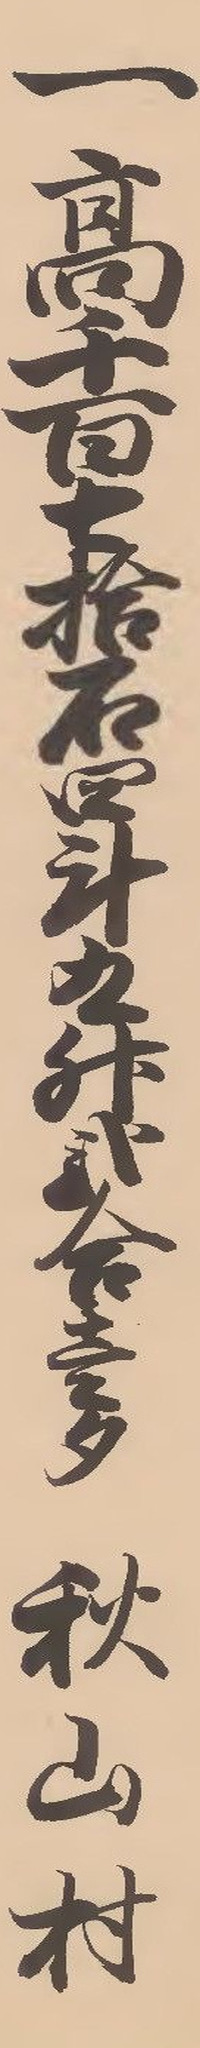一高千百七拾石四斗九升弐合壱勺秋山村
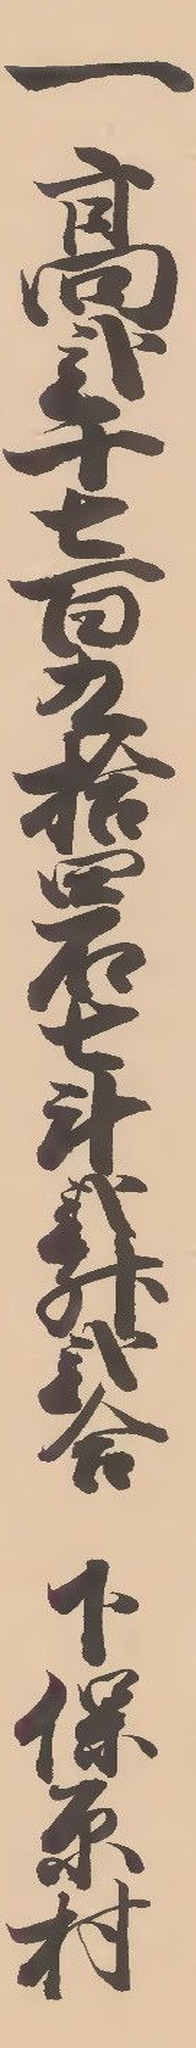一高弐千七百九拾四石七斗弐升弐合下保原村
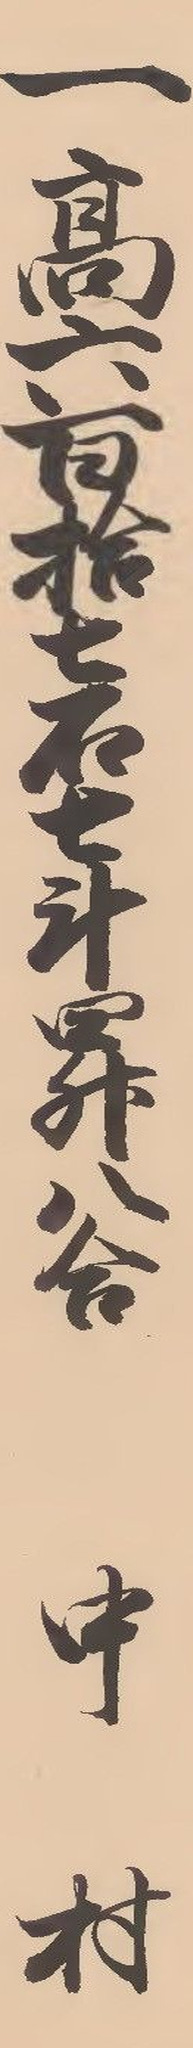一高六百拾七石七斗四升八合中村
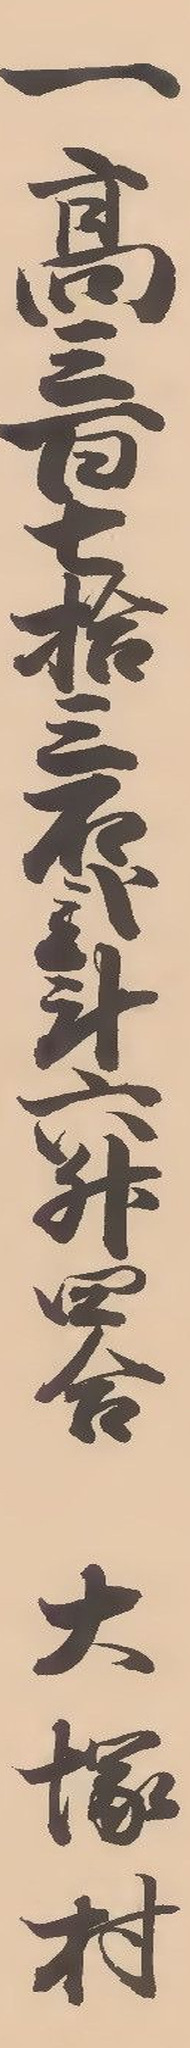一高三百七拾三石弐斗六升四合大塚村
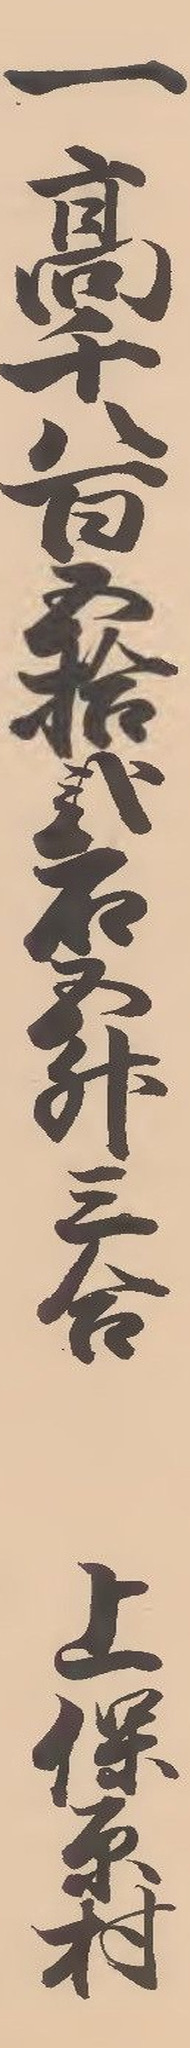一高千八百五拾弐石五升三合上保原村
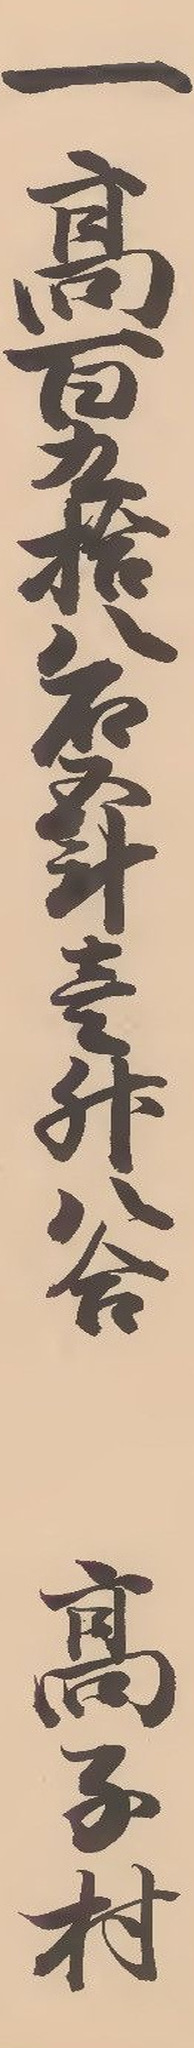一高百九拾八石五斗壱升八合高子村

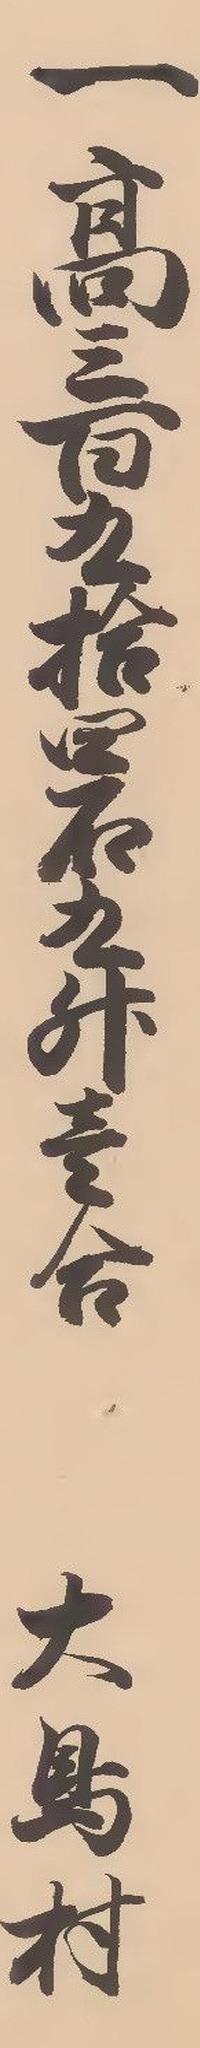一高三百九拾四石九升壱合大鳥村
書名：陸奥国郷帳　４
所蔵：国立公文書館 National Archives of Japan
